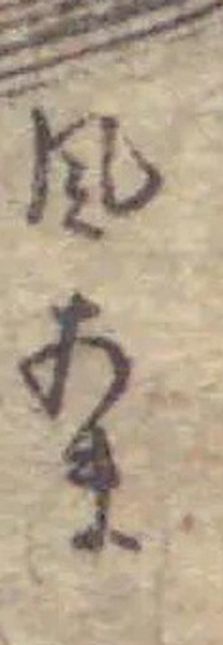風あま
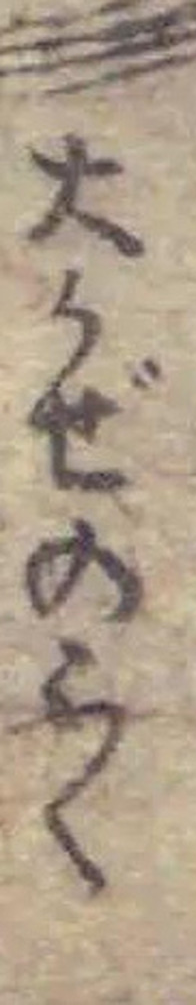大かぜのふく
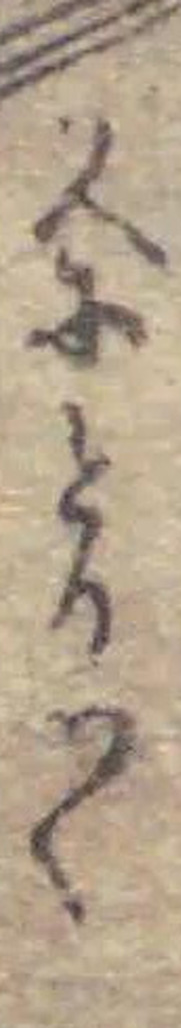人にとりつく
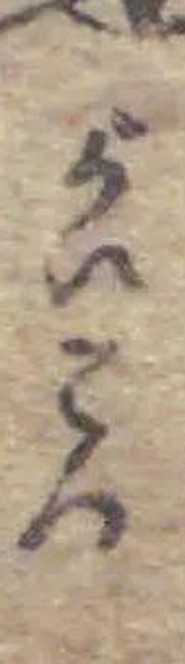がいこつ
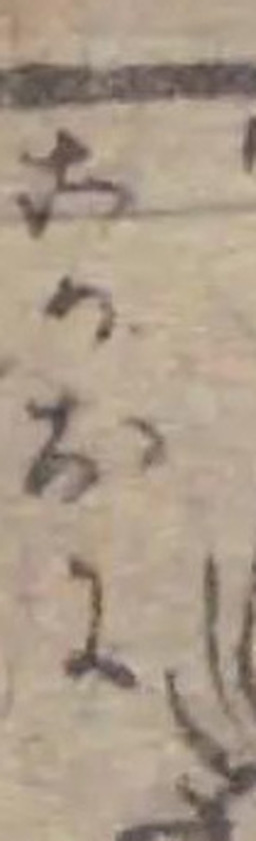あかおに
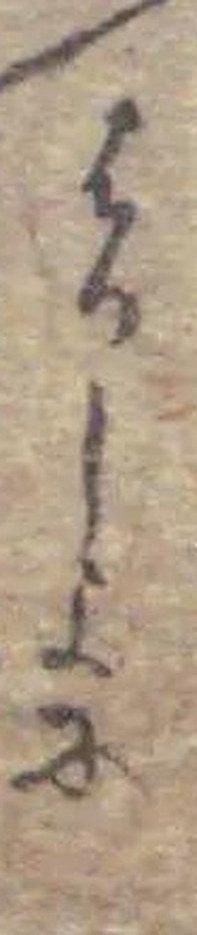はかしよに
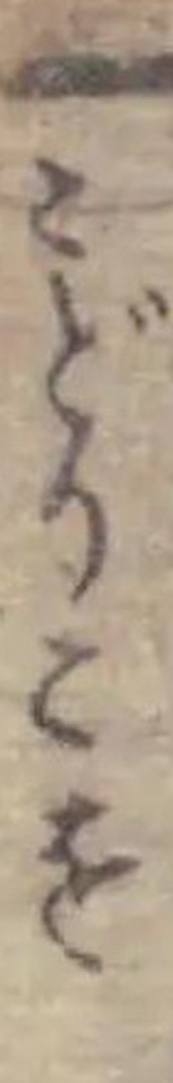みどりこを
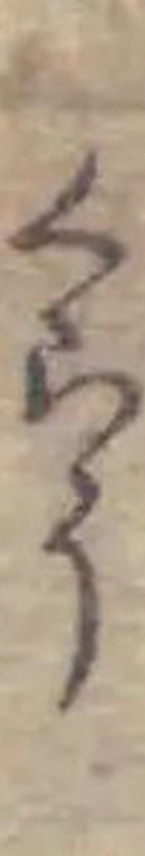くらう
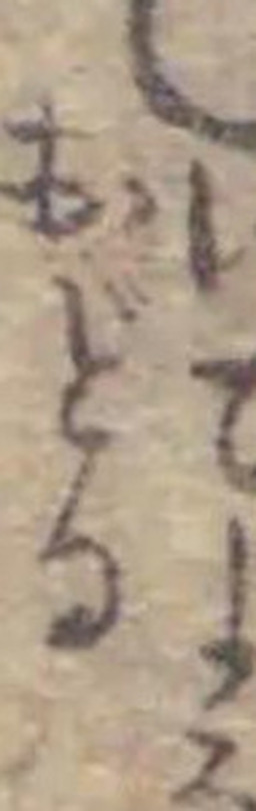おどる

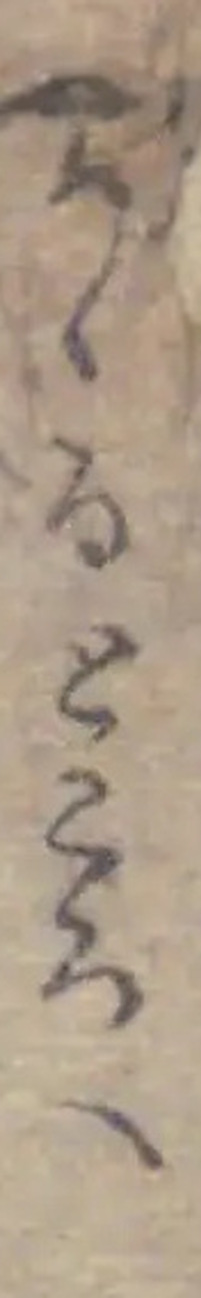かゝるところへ
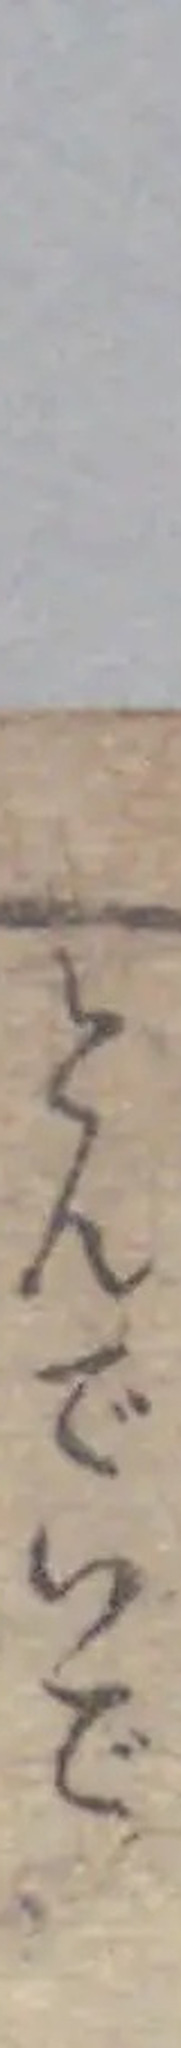とんでいで
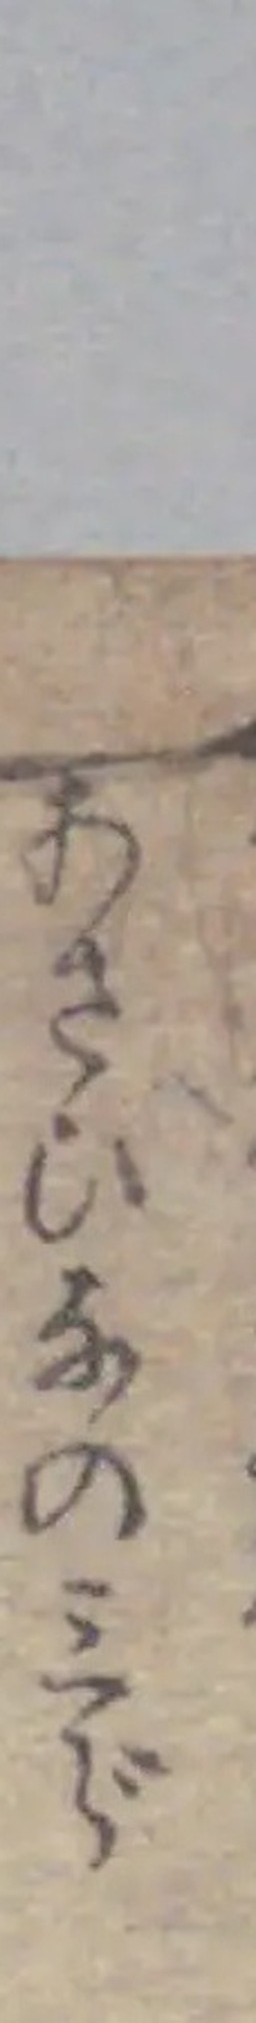あさひなの三郎
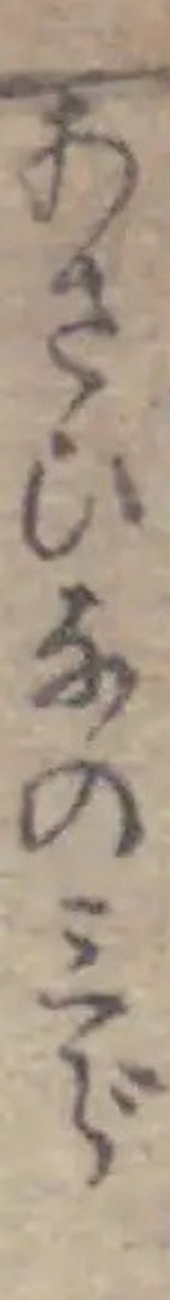あさひなの三郎
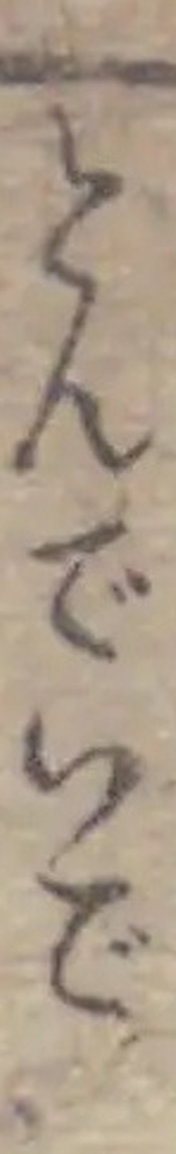とんでいで
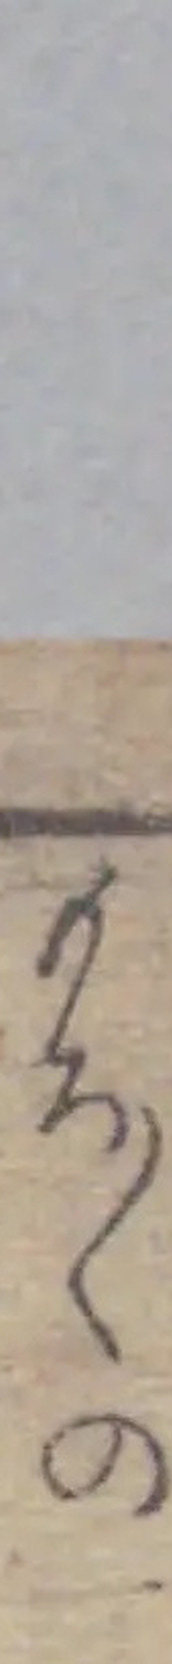もろ〳〵の
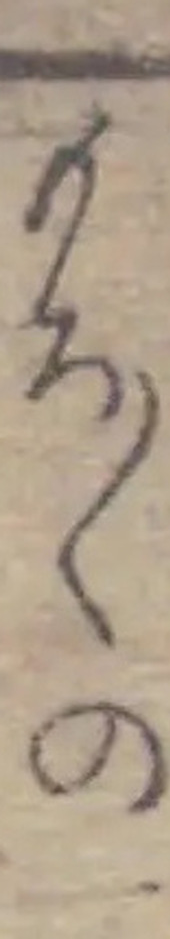もろ〳〵の
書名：夭怪着到牒 2巻
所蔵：国立国会図書館 National Diet Library, JAPAN
